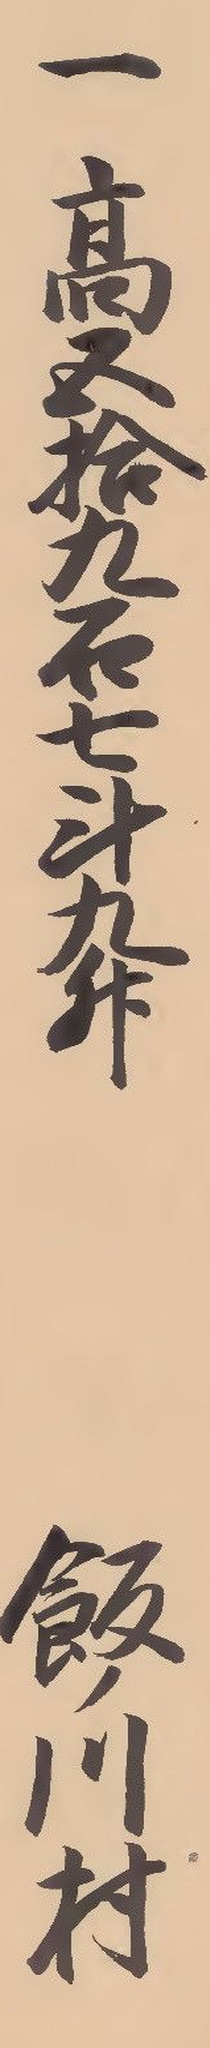一髙五拾九石七斗九升飯ノ川村
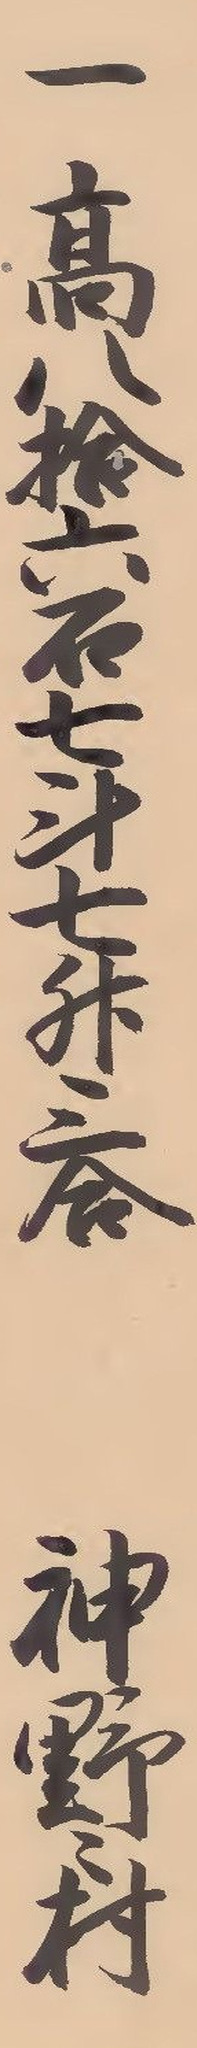一髙八拾六石七斗七升三合神野々村

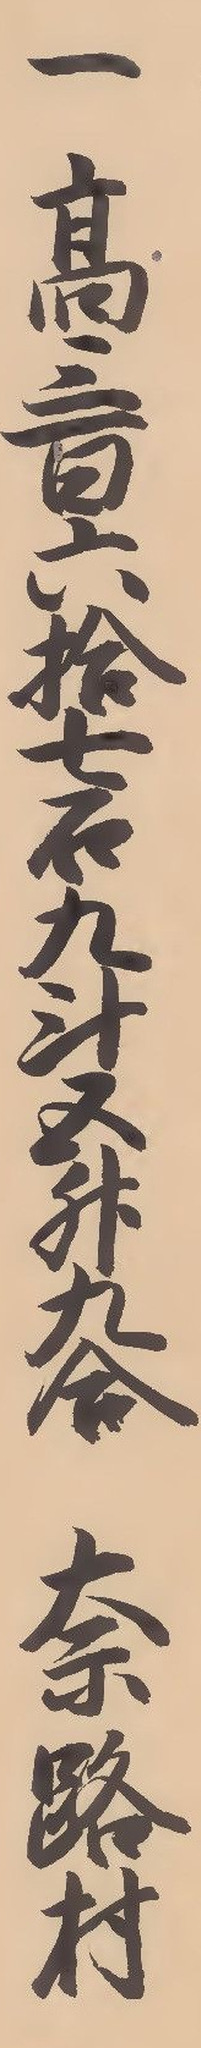一髙三百六拾七石九斗五升九合奈路村
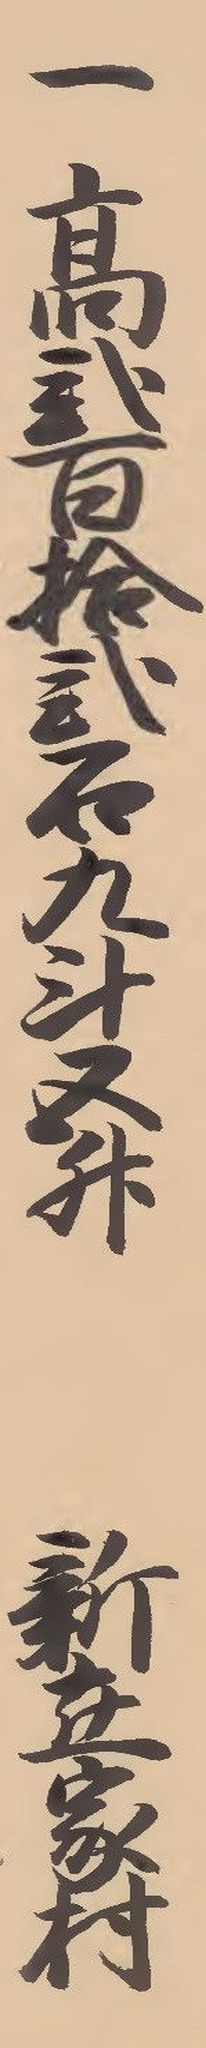一髙弐百拾弐石九斗五升新庄家村
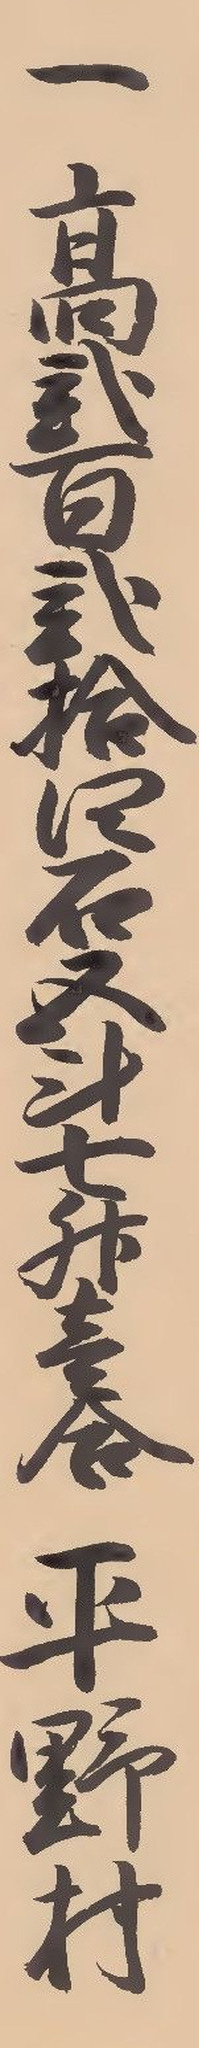一髙弐百弐拾四石五斗七升壱合平野村
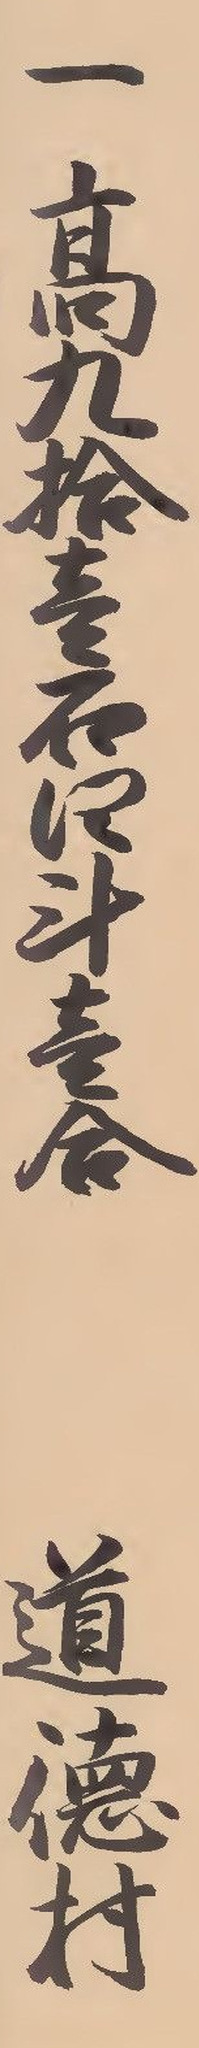一髙九拾壱石四斗壱合道徳村
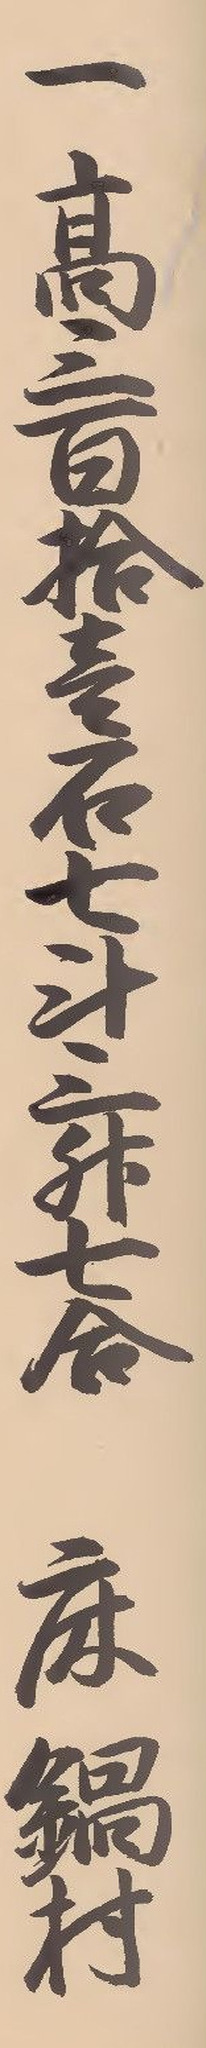一髙三百拾壱石七斗三升七合床鍋村
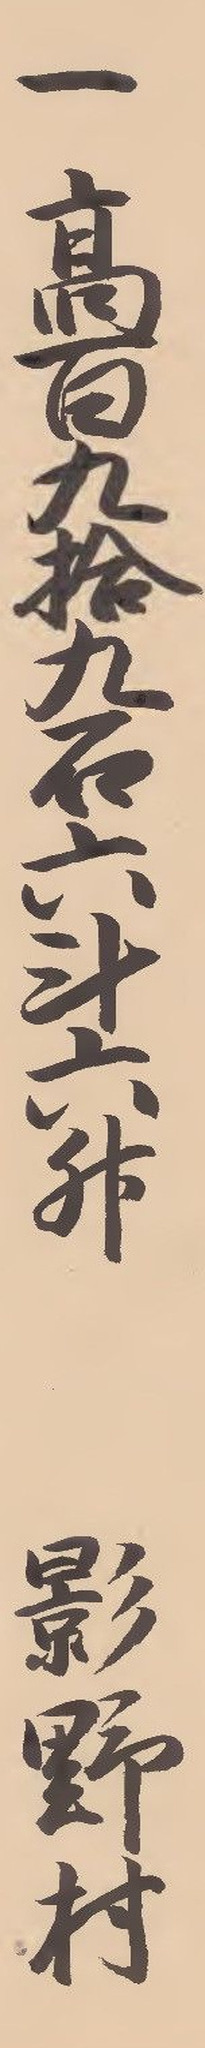一髙百九拾九石六斗六升影野村
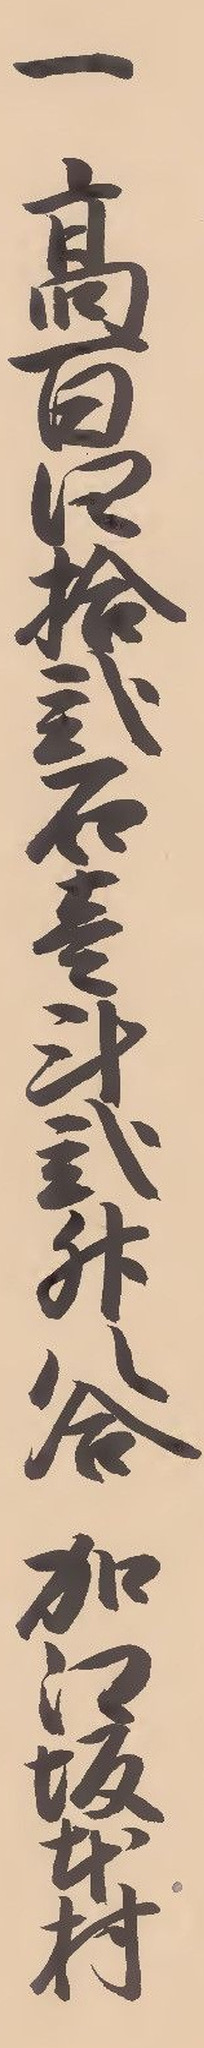一髙百四拾弐石壱斗弐升八合加江坂本村
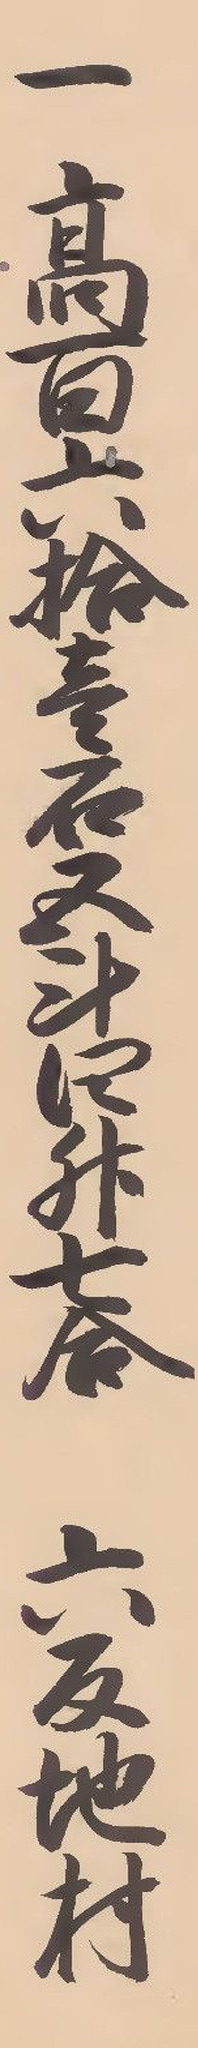一髙百六拾壱石五斗四升七合六反地村

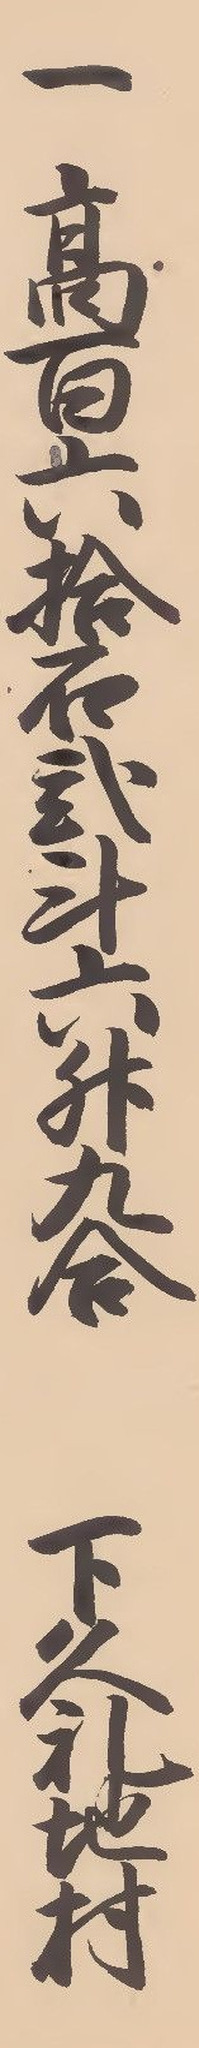一髙百六拾石弐斗六升九合下久礼地村
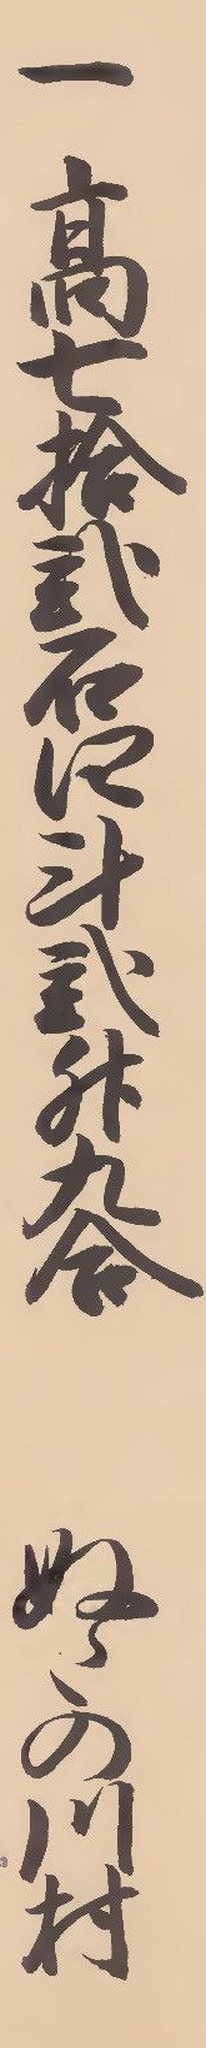一髙七拾弐石四斗弐升九合ぬたの川村
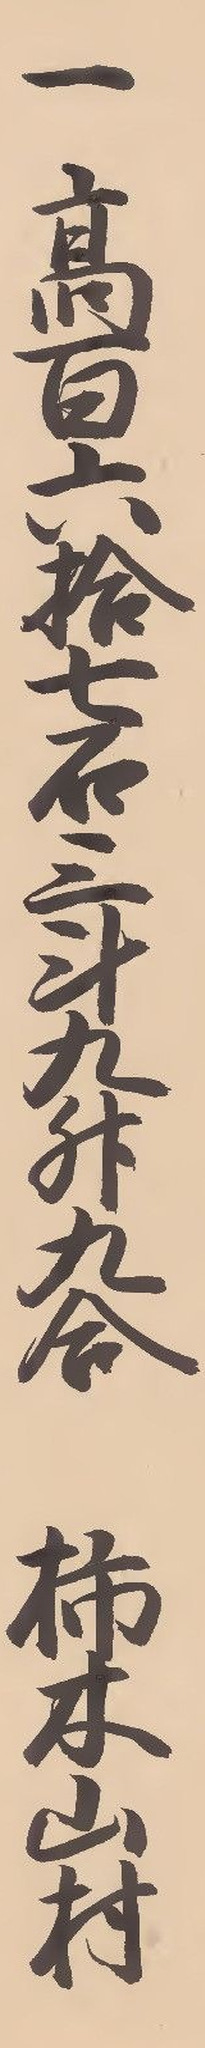一髙百六拾七石三斗九升九合柿木山村
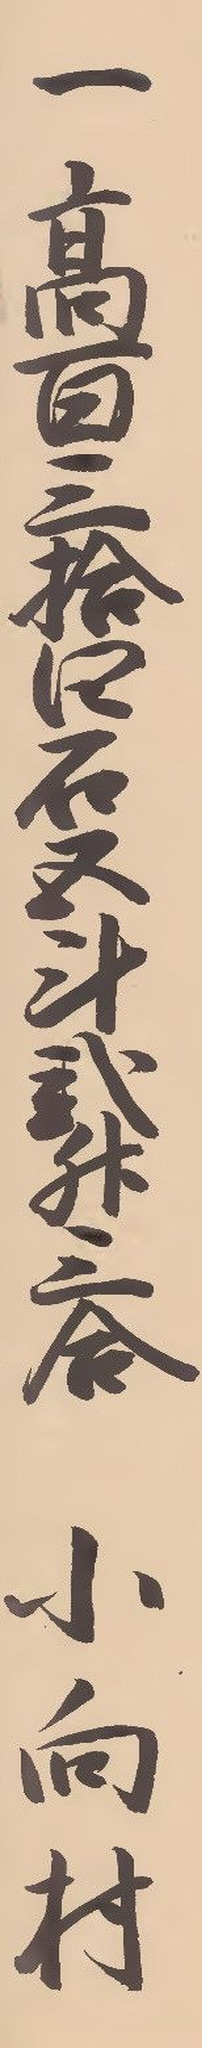一髙百三拾四石五斗弐升三合小向村
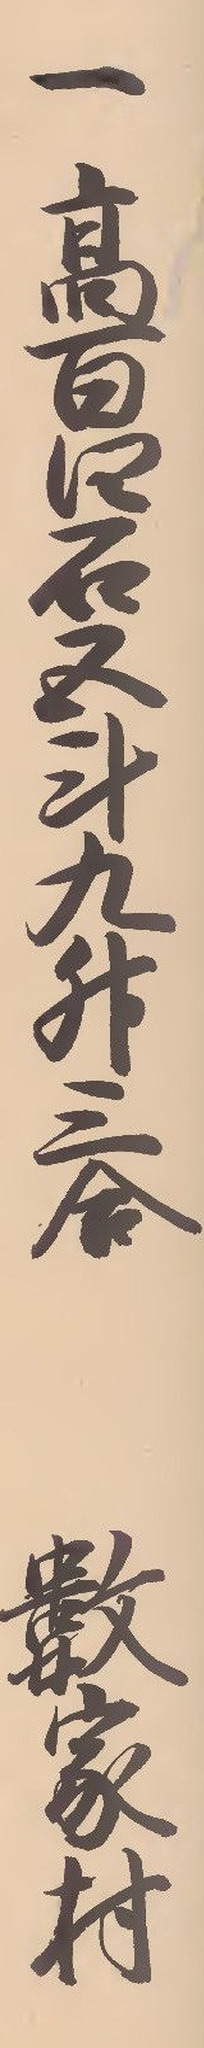一髙百四石五斗九升三合數家村
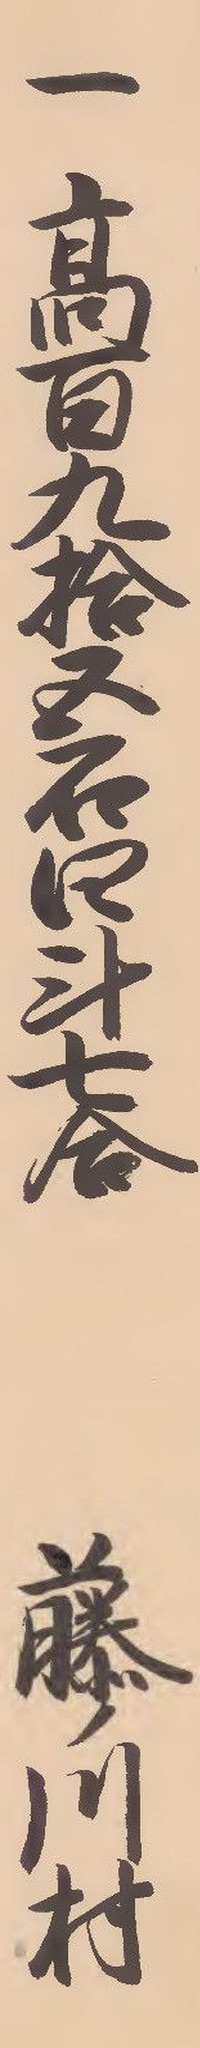一髙百九拾五石四斗七合藤ノ川村
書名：土佐国郷帳
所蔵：国立公文書館 National Archives of Japan
